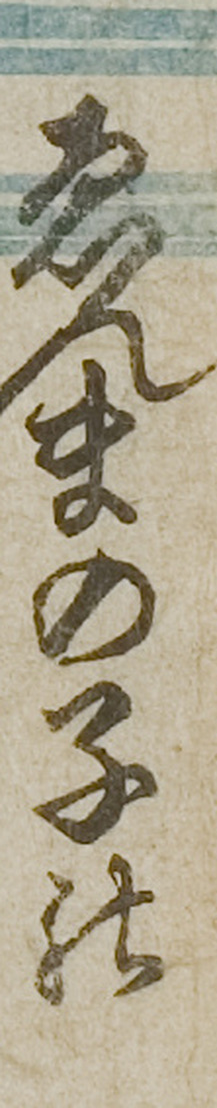ゑんまの子の
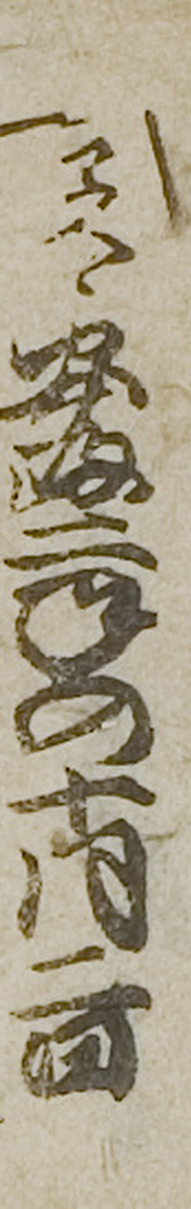「ゑゝ安政二年の十月二日
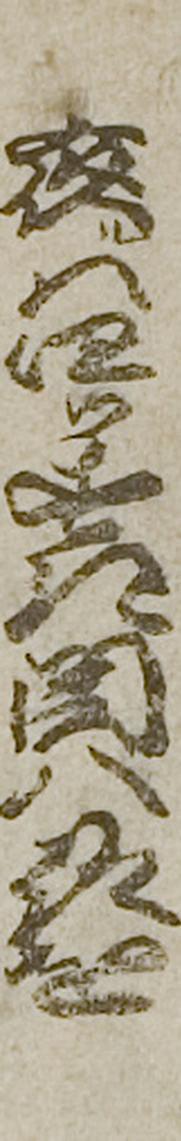夜るは四つとすき関八州を
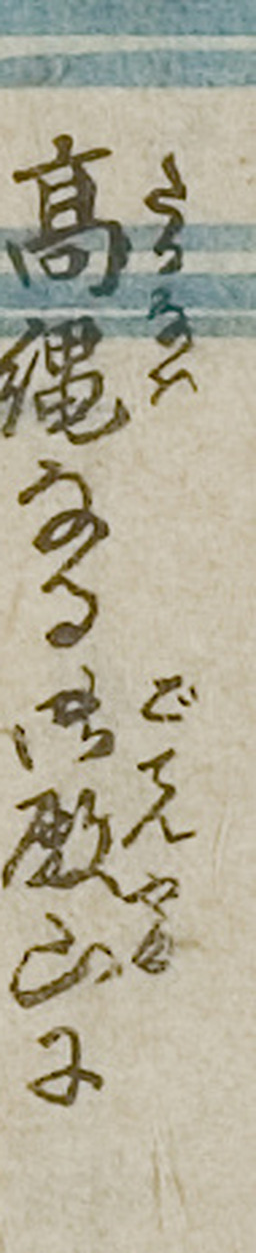高縄なる御殿山に
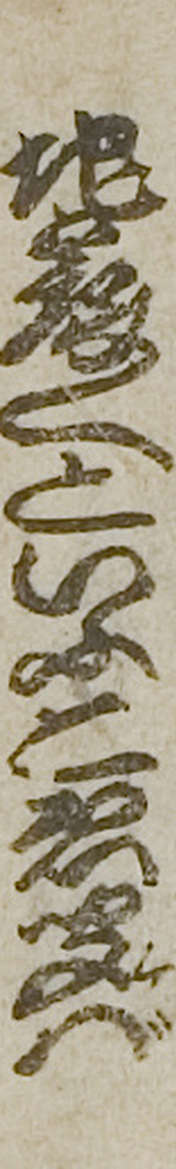地震〳〵といふこゑ聞けば
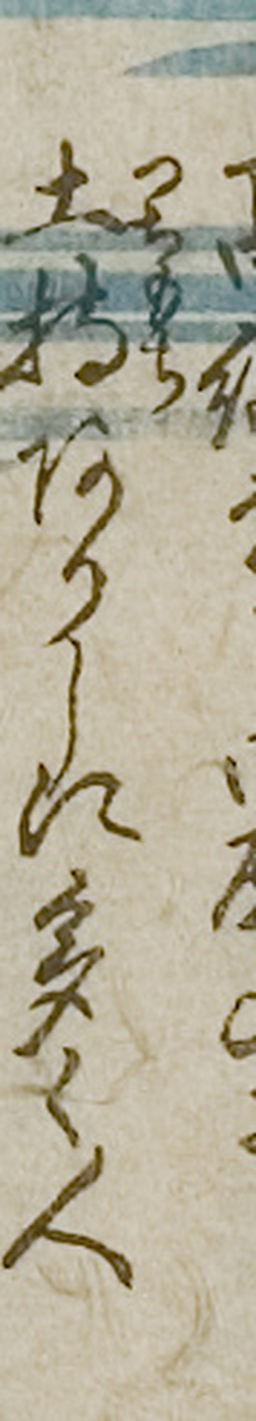土持ありしに多く人
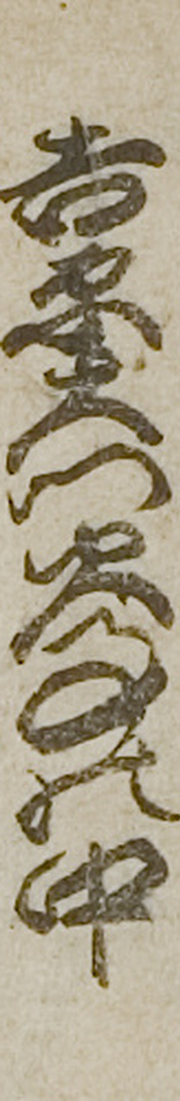吉原大門火事の中
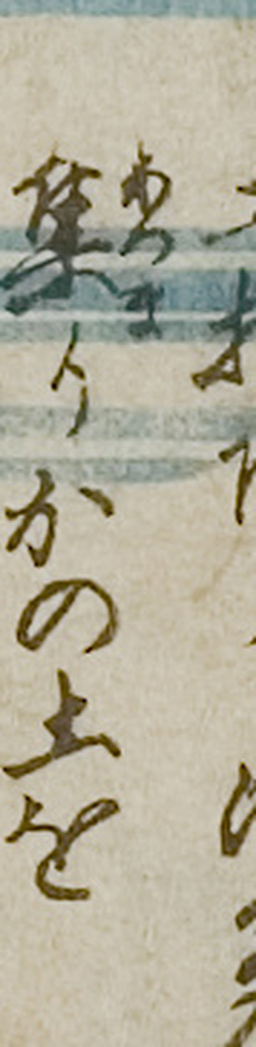集りかの土を
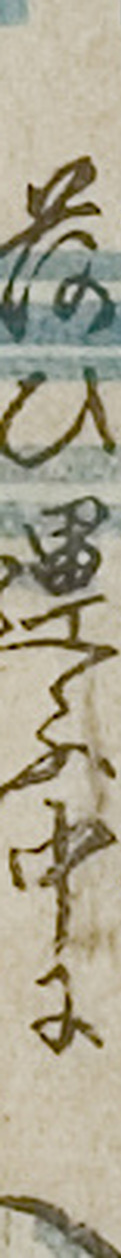荷ひ運ふ中に
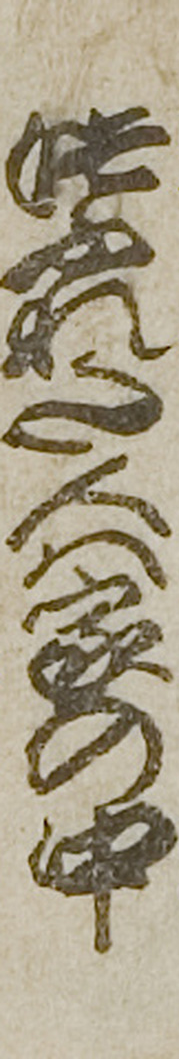つふれた人は家の中
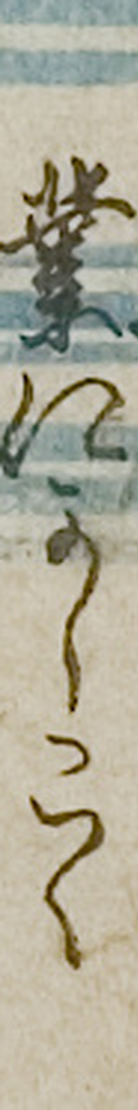業にかしこく
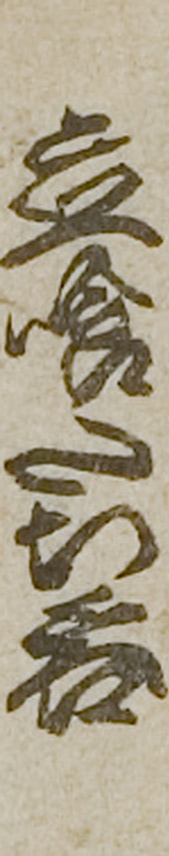立喰たち呑
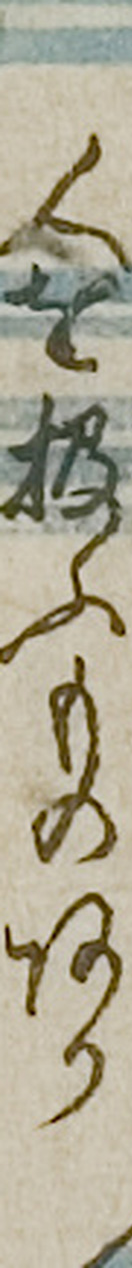人を扱ふものあり
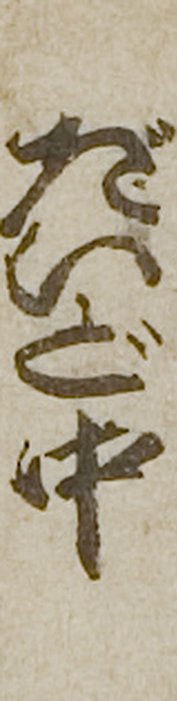だいど中
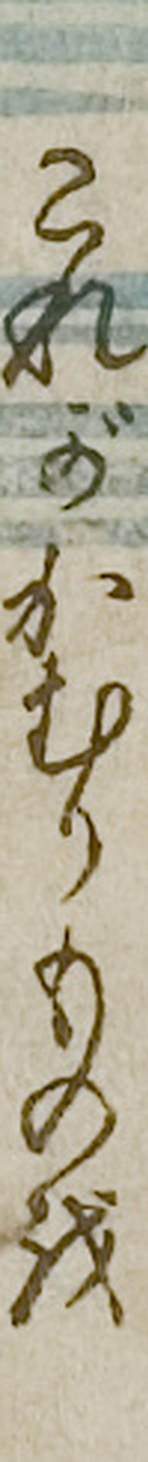これがかむりものを
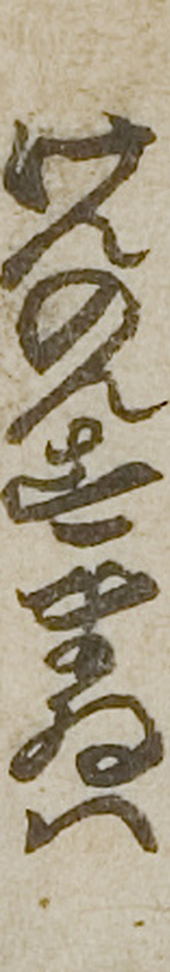けんのんすまゐは
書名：ゑんまの子のわけ
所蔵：東京大学総合図書館 General Library in the University of Tokyo, JAPAN
